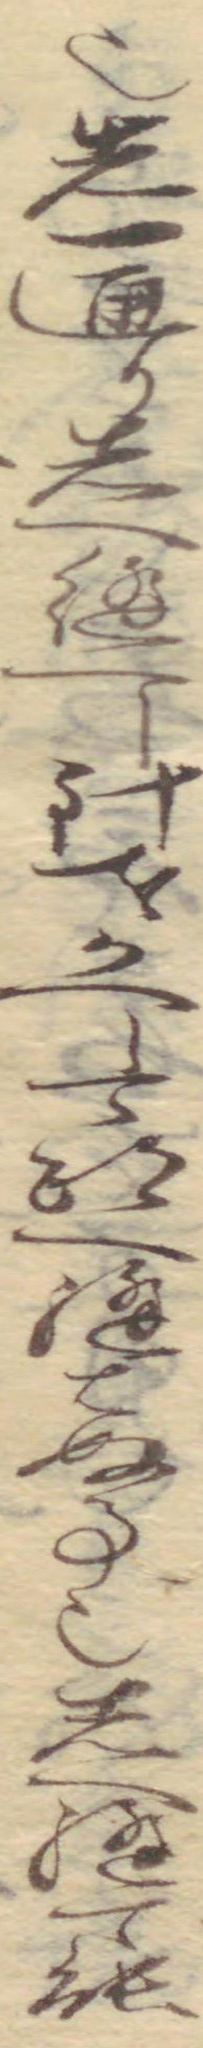也先一通り先へ縫へし針をかへして跡へ縫はぬ事也先へ縫て能
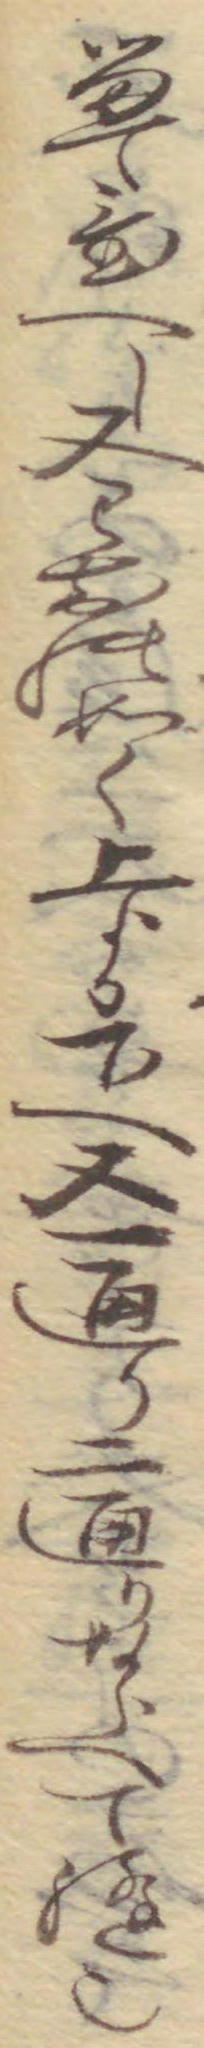留て置へし又已前の如く上より下へ又一通り二通りならへて縫也
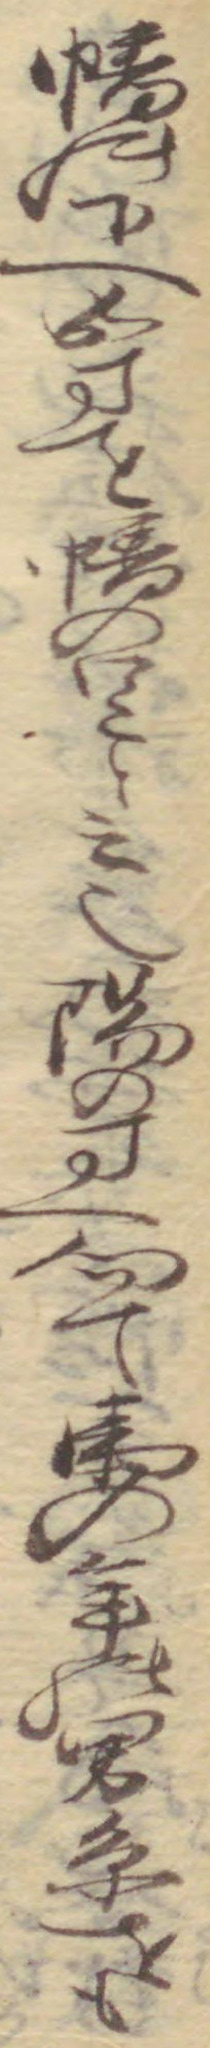幡の下へ成方を幡の足と云也陽の方へ向て馬の年の男糸をも
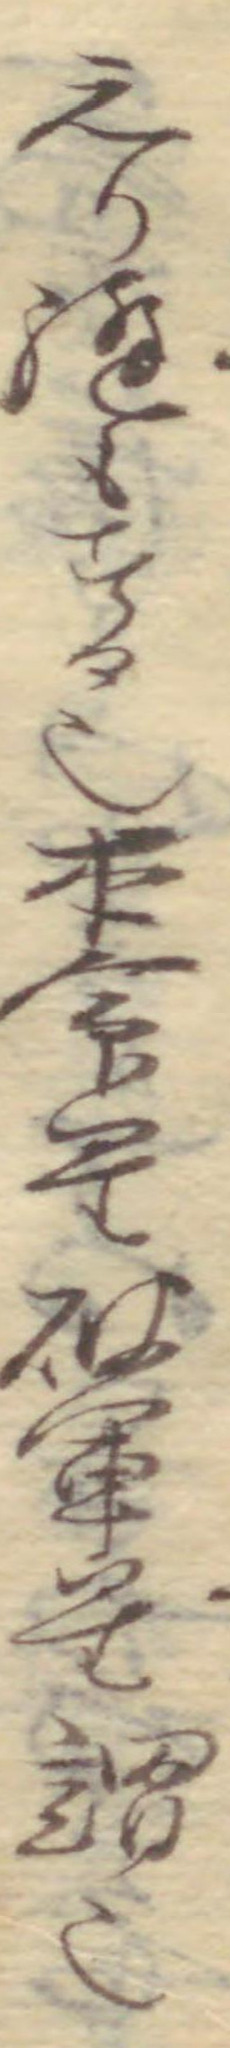えり縫もする也本命星破軍星謂也
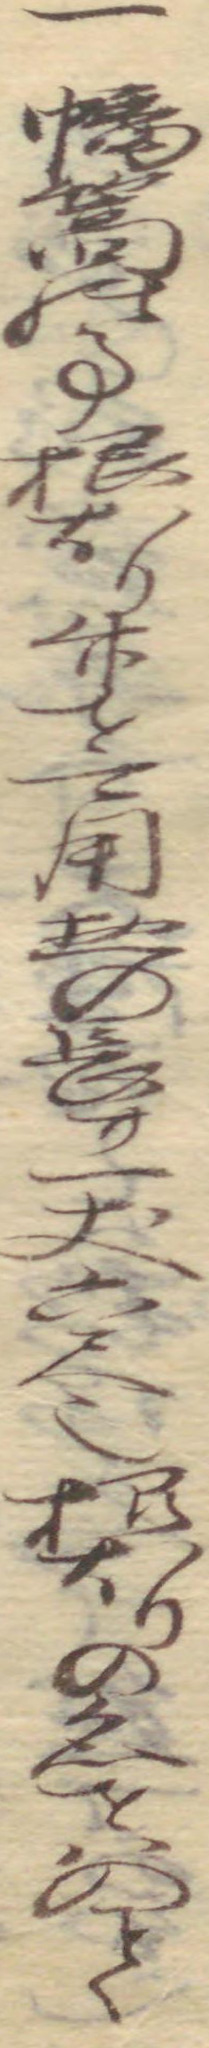一幡篙の事根ほり竹を可用惣の長さ一丈六尺根ほりの名をハのそく
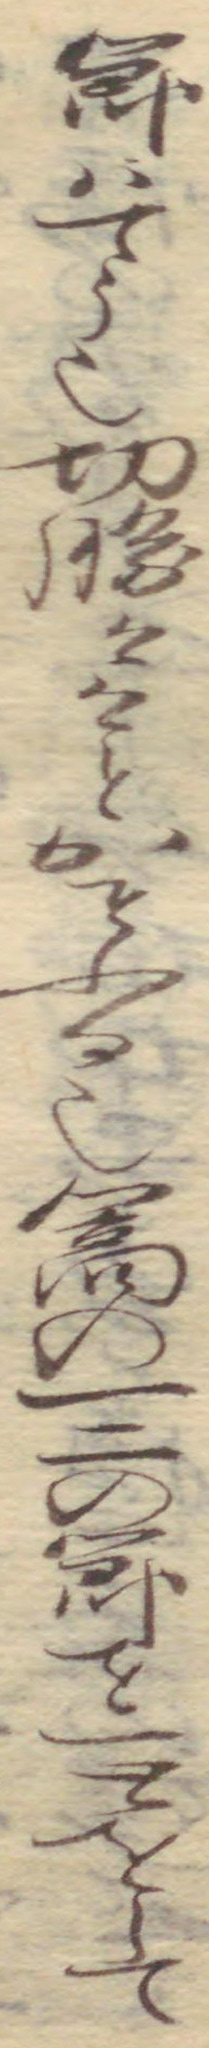節ハてう也切勝々々とかそふる也篙の一二の節を一とをして
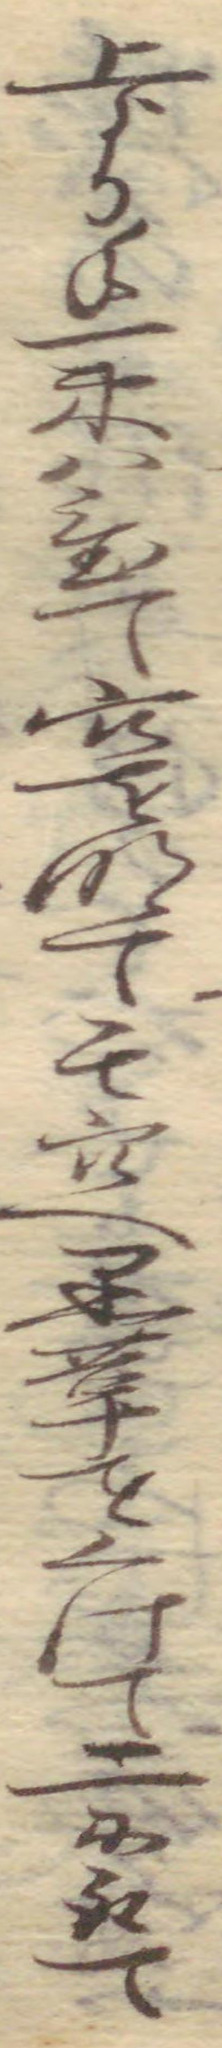上より手一束ハ置て穴を明て其穴へ黒革をくけて二に取て
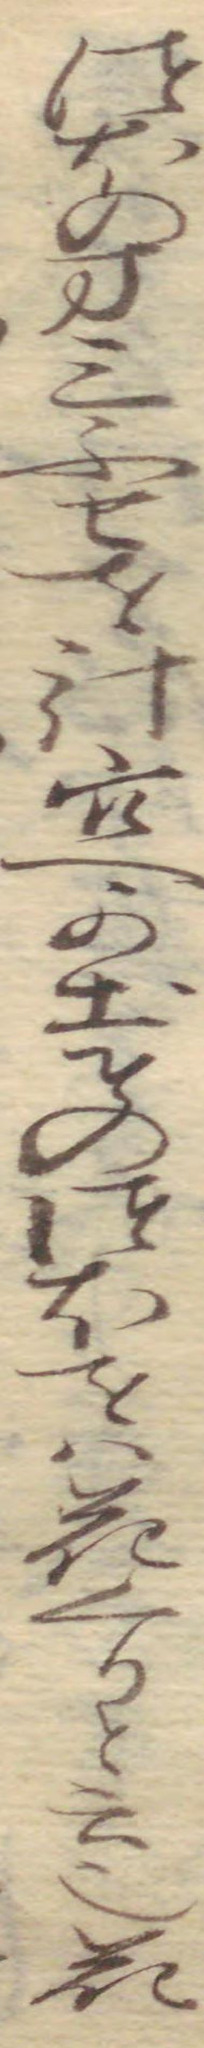つほの方三ふせを計穴へ可出そのつほをハ花くりと云也花
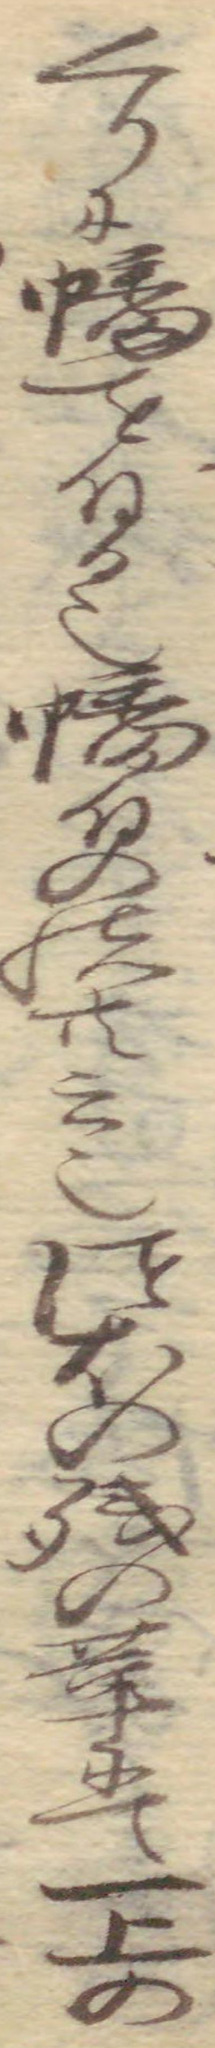くりに幡を付る也幡付の緒共云也つほの残の革にて一上の
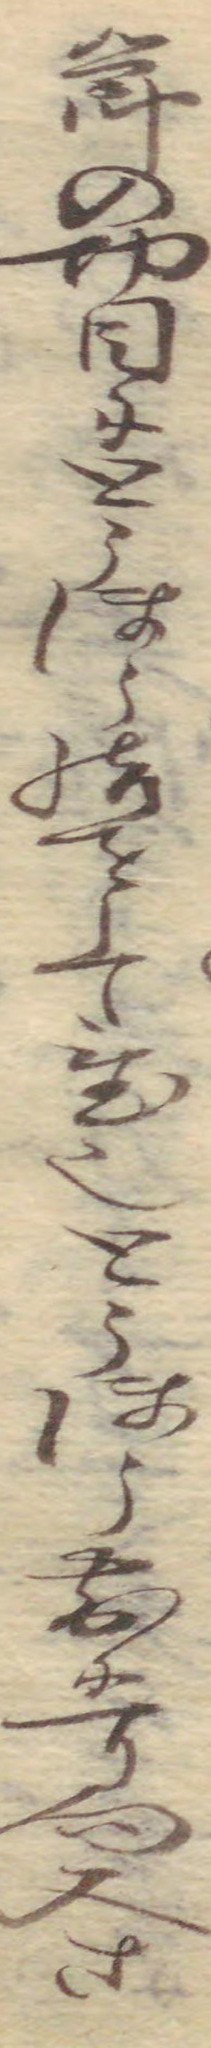節の切目にとうほう結をして置也とうほう前に可向又さ
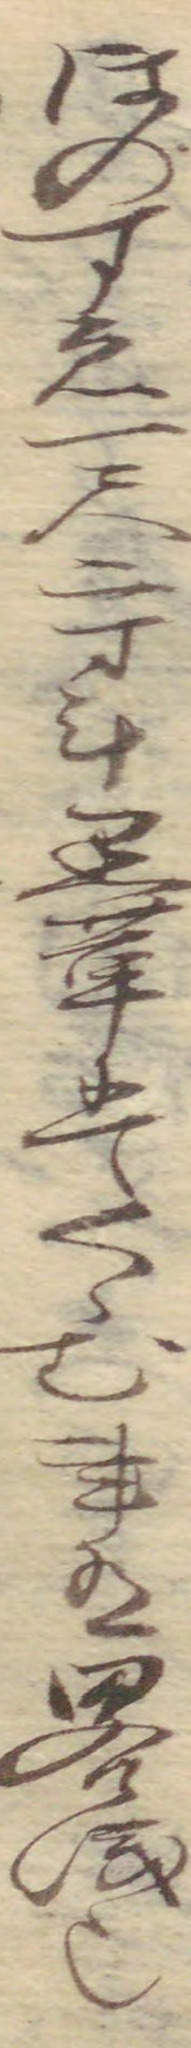ほのすゑ一尺二寸斗黒革にてくゝむ事有畧儀也
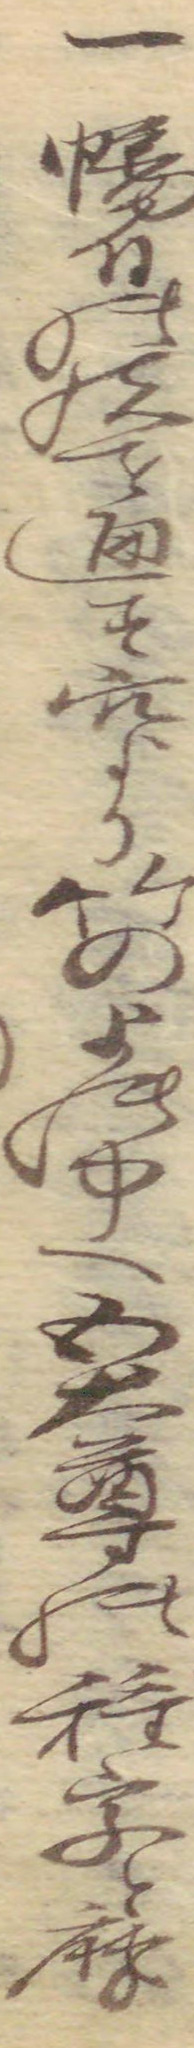一幡付の緒を通す穴より竹のよの中へ五大尊の種字と摩

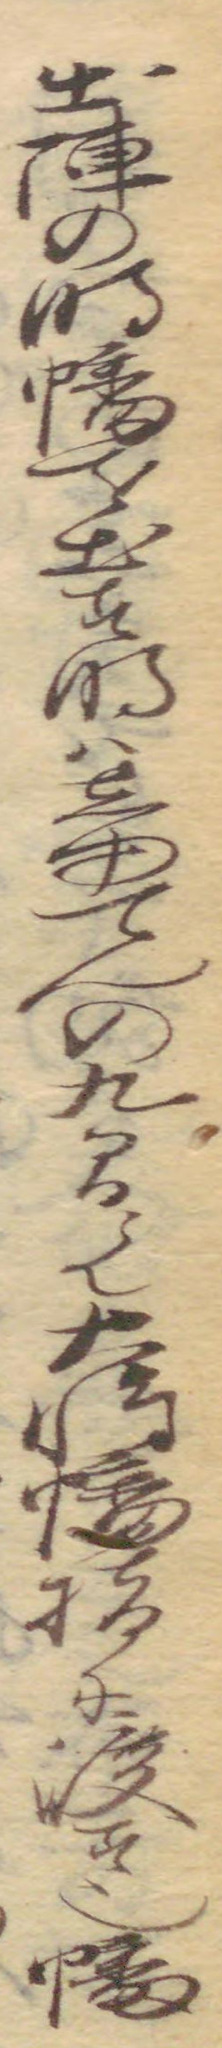一出陣の時幡を出す時はしゆてんの九間ニて大将幡指に渡す也幡
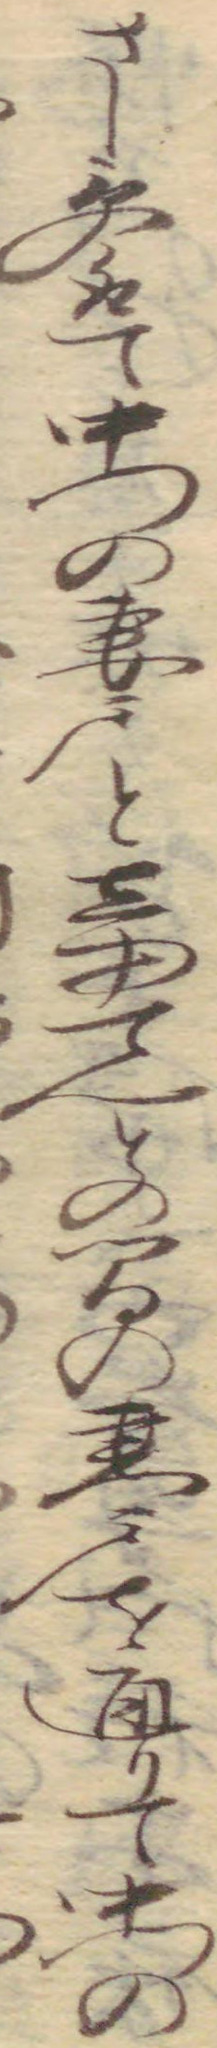さし受取て中門の妻戸としゆてんとの間の妻戸を通りて中門の
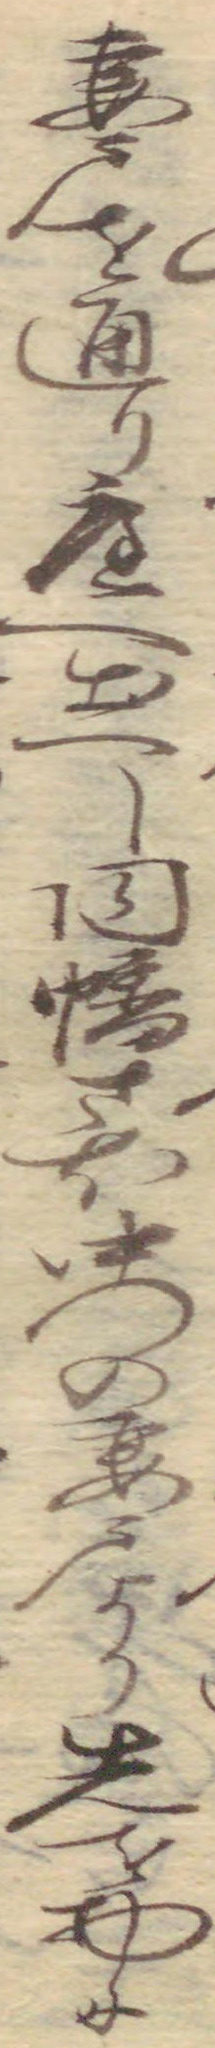妻戸を通り庭へ出へし同幡さほ中門の妻戸より先を物に
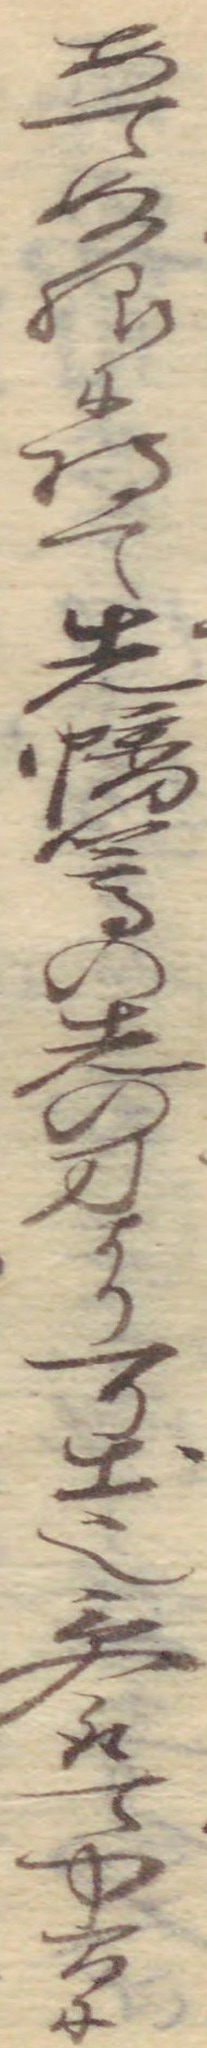あてぬ様に持て先幡竿の先の方より可出也受取て中間に
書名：鶯宿雑記. 巻199-200
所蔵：国立国会図書館 National Diet Library, JAPAN
